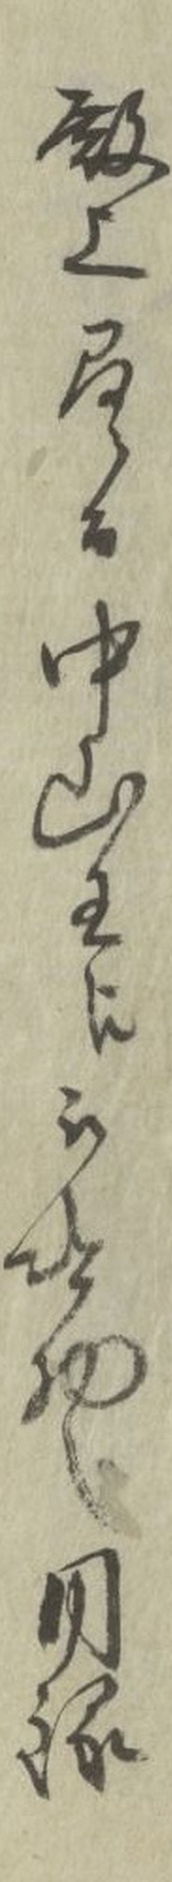殿上間に而中山王え被遣物之目録
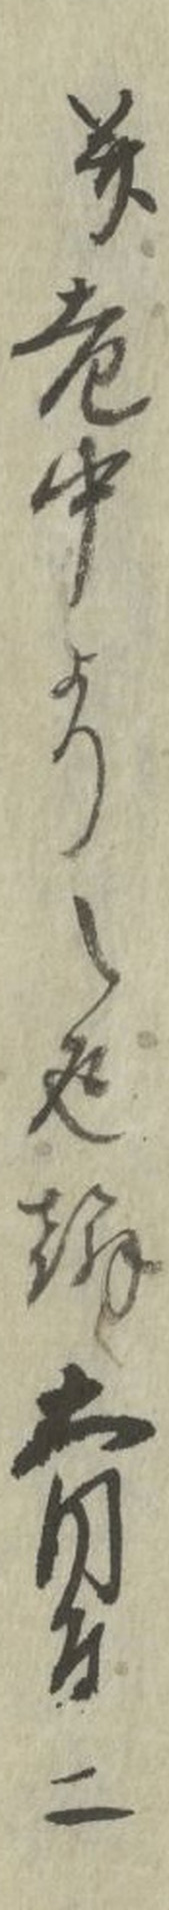幷老中より之返翰大目付二
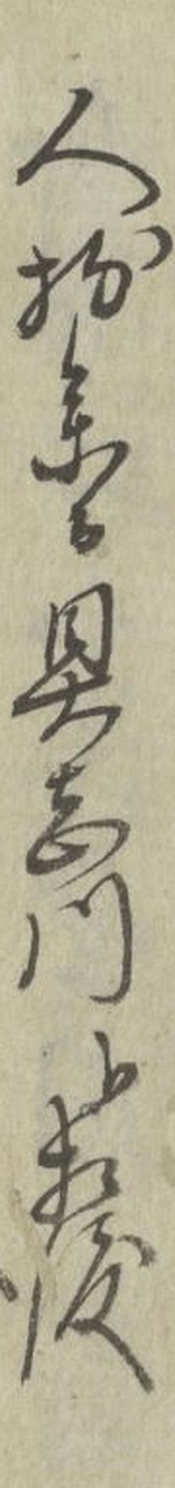人持参而具志川え相渡
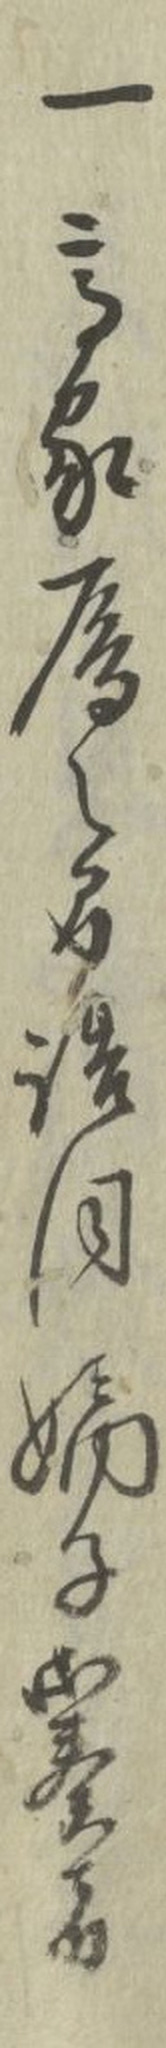一高家雁之間詰同嫡子御奏者
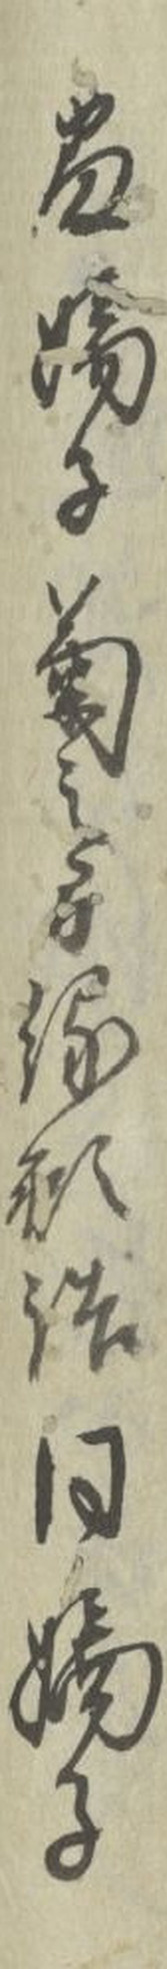番嫡子菊之間縁頬詰同嫡子
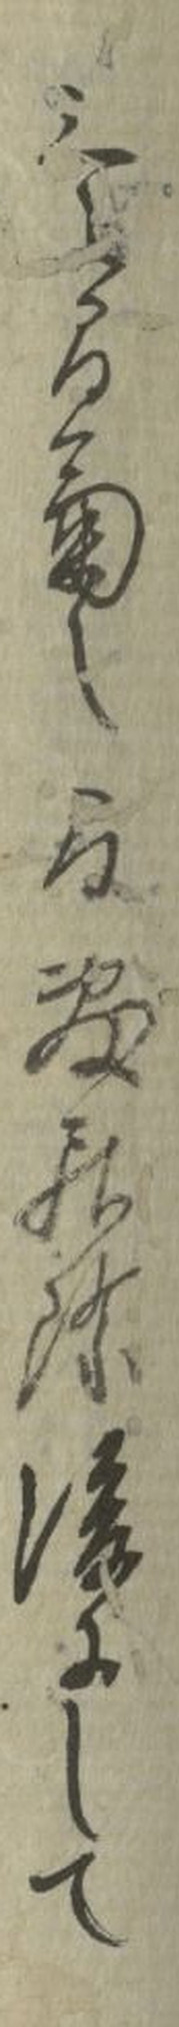三之間菊之間敷居際後にして
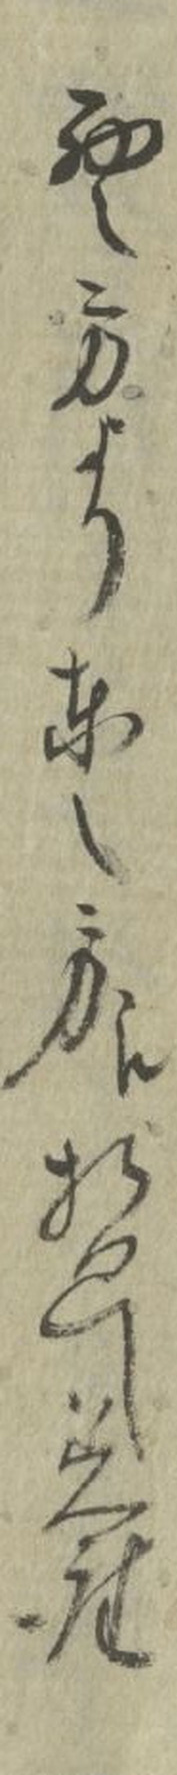西之方より東之方え折廻し着座
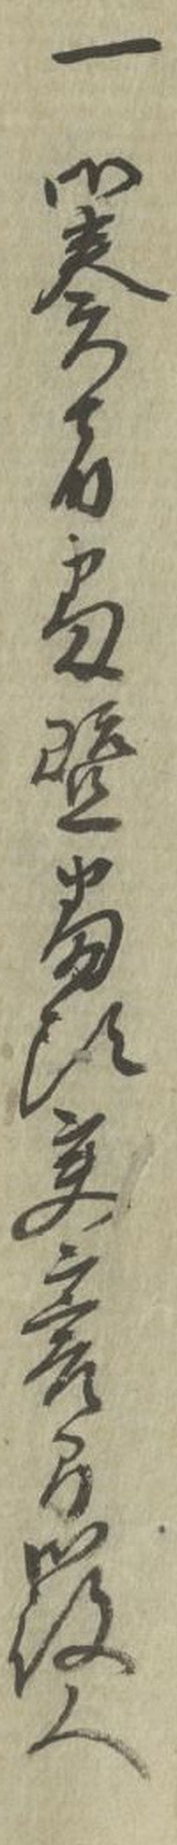一御奏者番頭廻番頭芙蓉間御役人
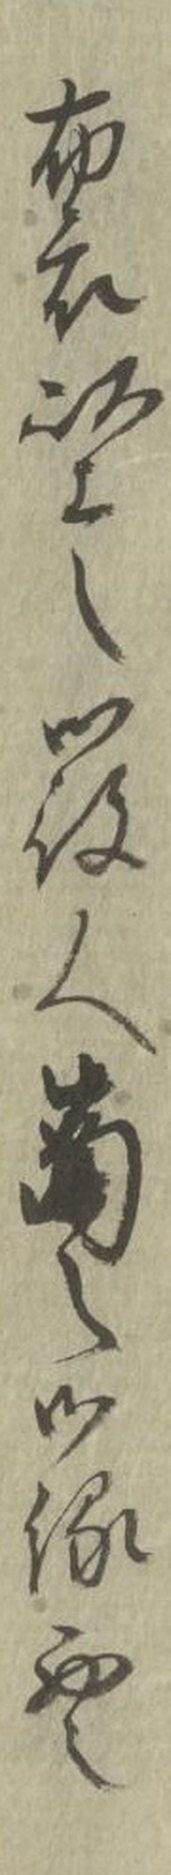布衣以上之御役人南之御縁西之
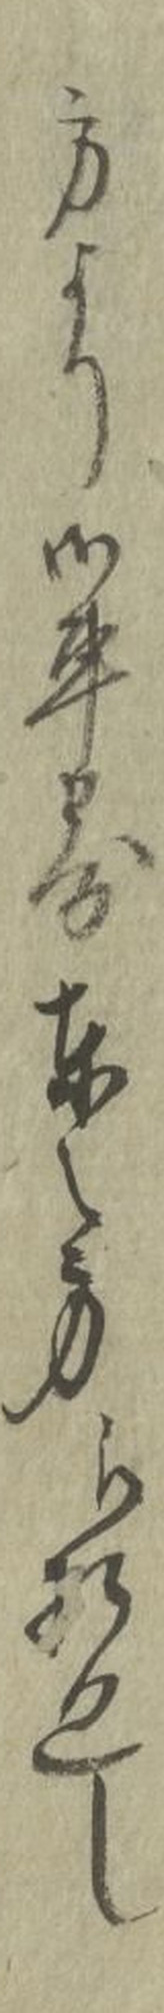方より御車寄東之方え折廻し

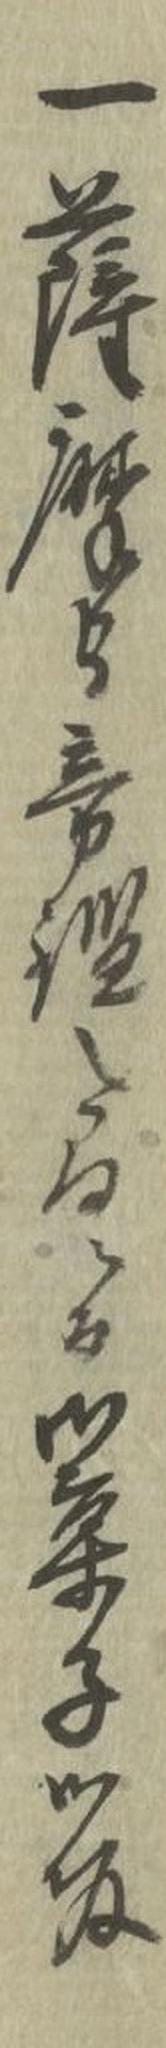一薩摩守帝鑑之間に而御菓子御吸
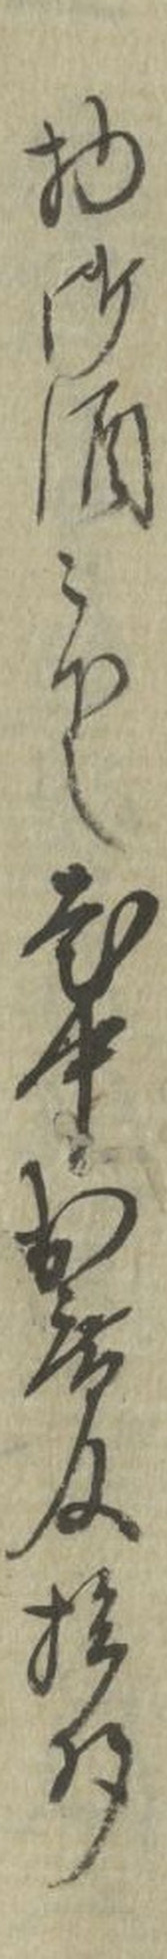物御酒被下之老中出席及挨拶
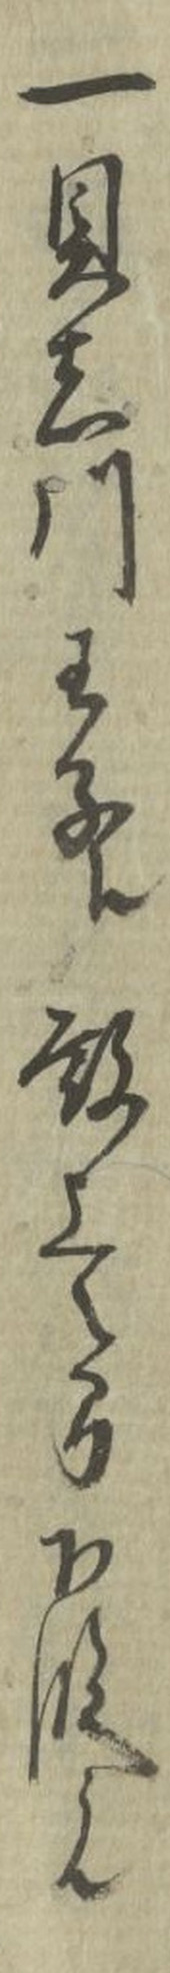一具志川王子え殿上之間下段に而
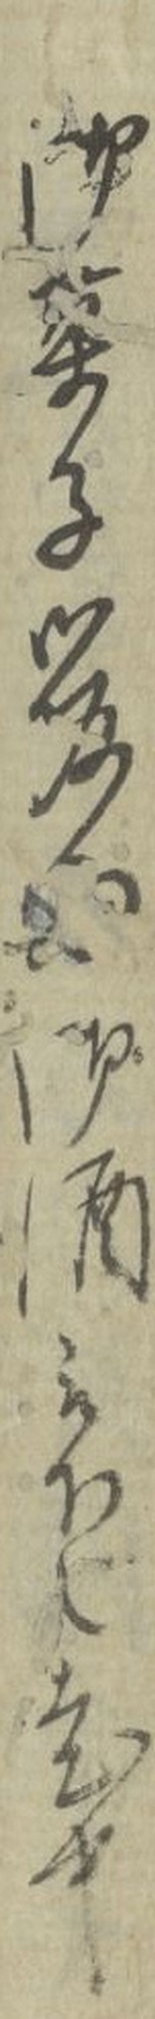御菓子御吸物御酒被下之老中
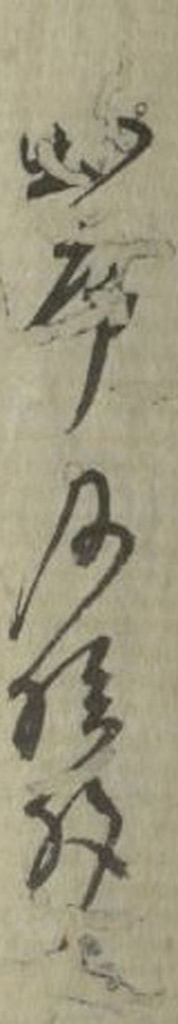出席及挨拶
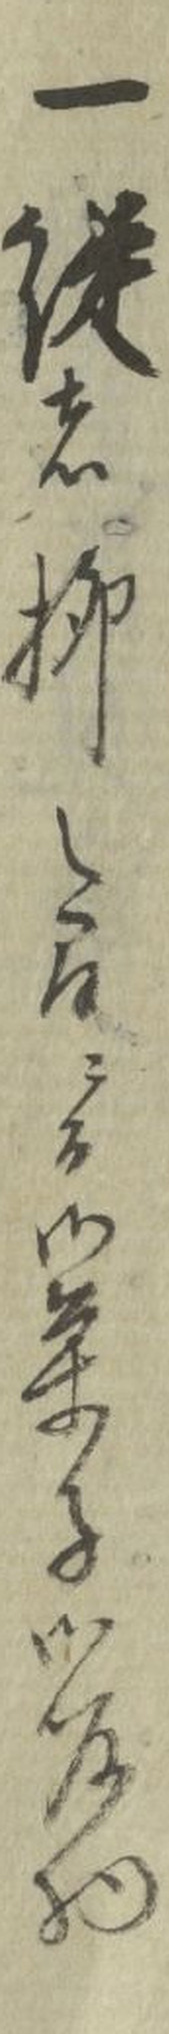一従者柳之間に而御菓子御吸物
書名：琉球来朝記 自八至十四終
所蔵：University of the Ryukyus Library
